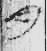月
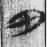甲
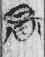晨
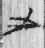之
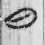日
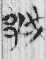○（越）
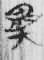異
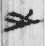之
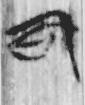司
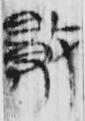敗
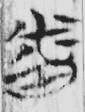番
